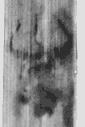心
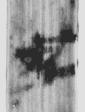𠁩
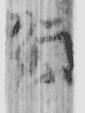凥
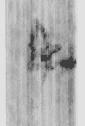身
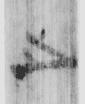之
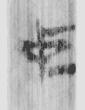𠁩
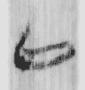㠯（以）
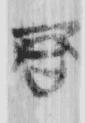君
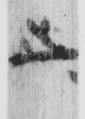之
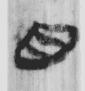目
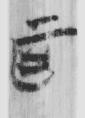耳
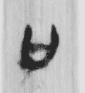口
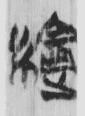{糸宀帝止}
